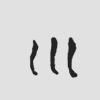川
